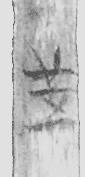{廿五}
